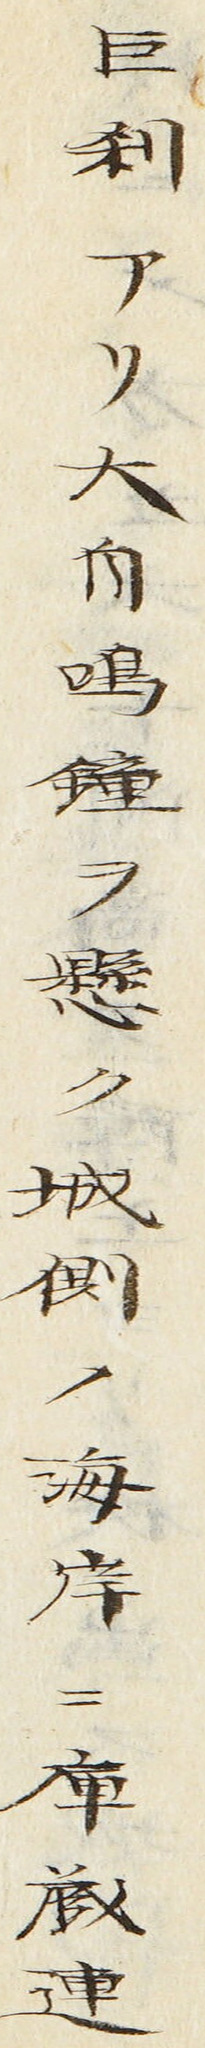巨刹アリ大自鳴鐘ヲ懸ク城側ノ海岸ニ庫蔵連
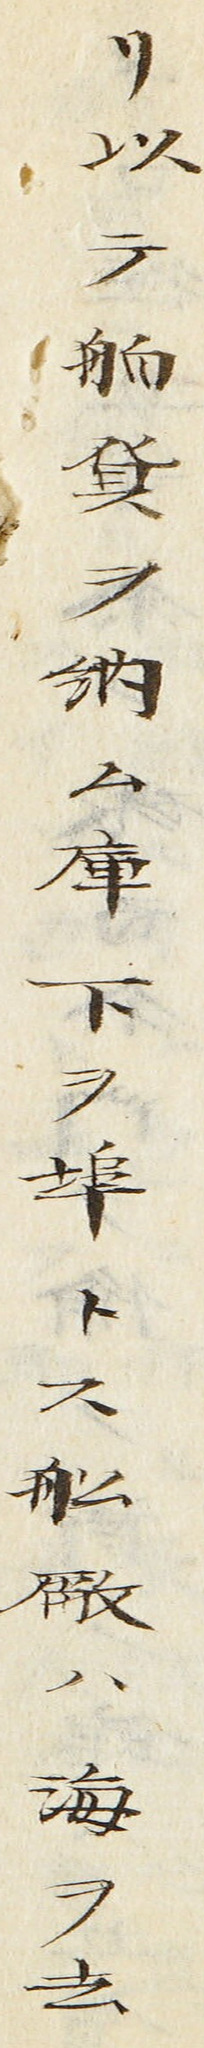リ以テ舶貨ヲ納ム庫下ヲ埠トス舩廠ハ海ヲ去
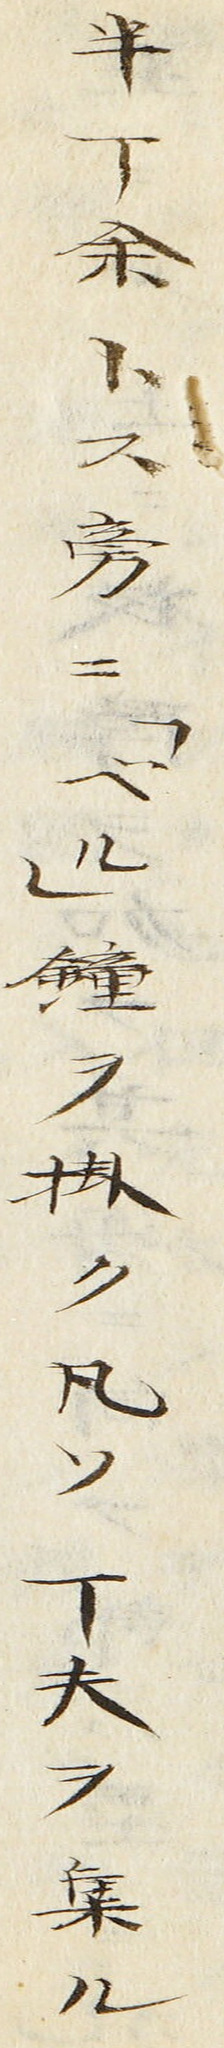半丁余トス旁ニ「ベル」鐘ヲ掛ク凡ソ丁夫ヲ集ル
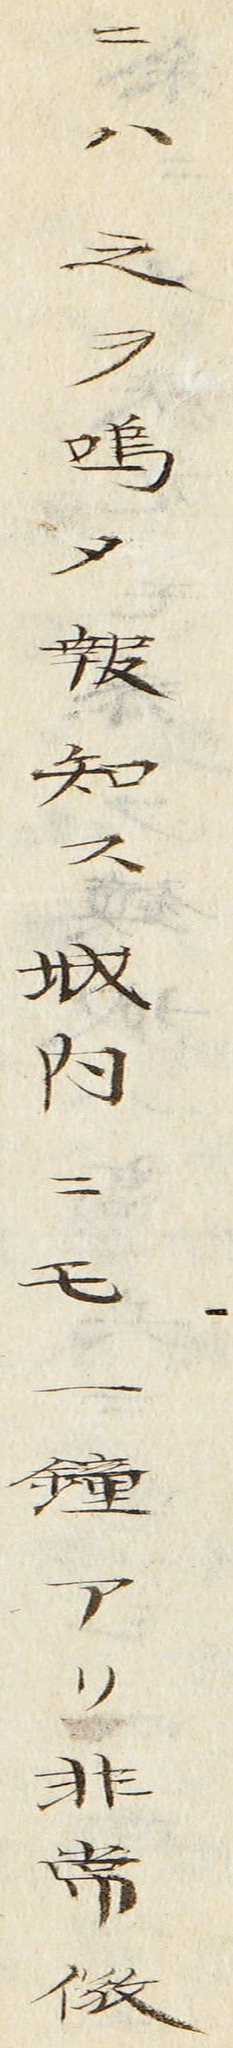ニハ之ヲ鳴シテ報知ス城内ニモ一鐘アリ
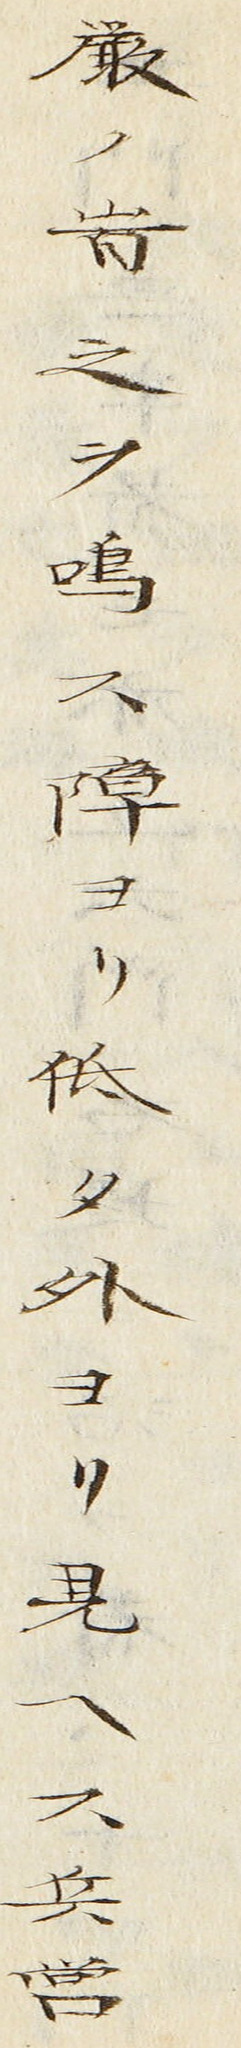厳ノ旹之ヲ鳴ス障ヨリ低ク外ヨリ見ヘス兵営
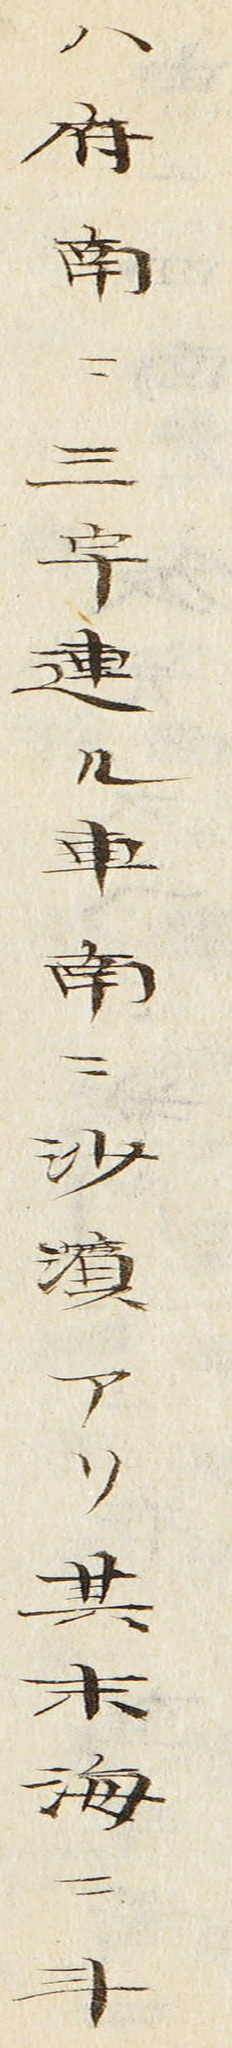ハ府南ニ三宇連ル車南ニ沙濱アリ其末海ニ斗
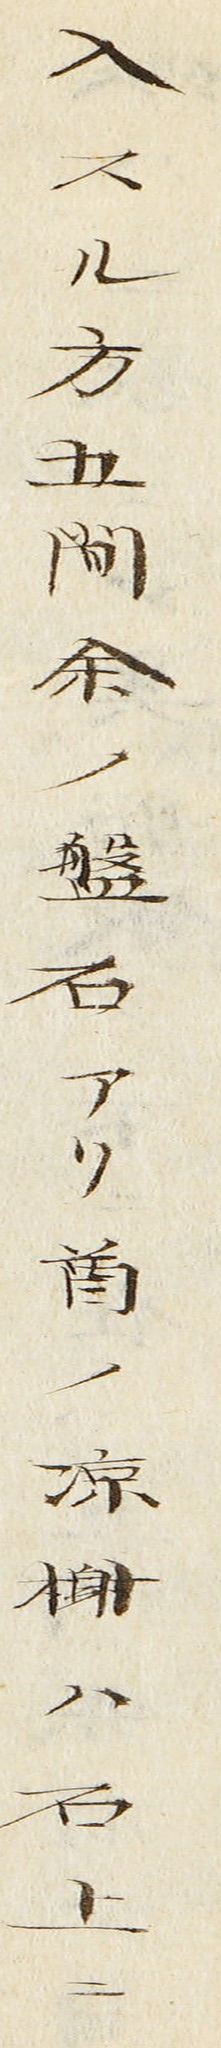入スル方五間余ノ盤石アリ酋ノ凉榭ハ石上ニ
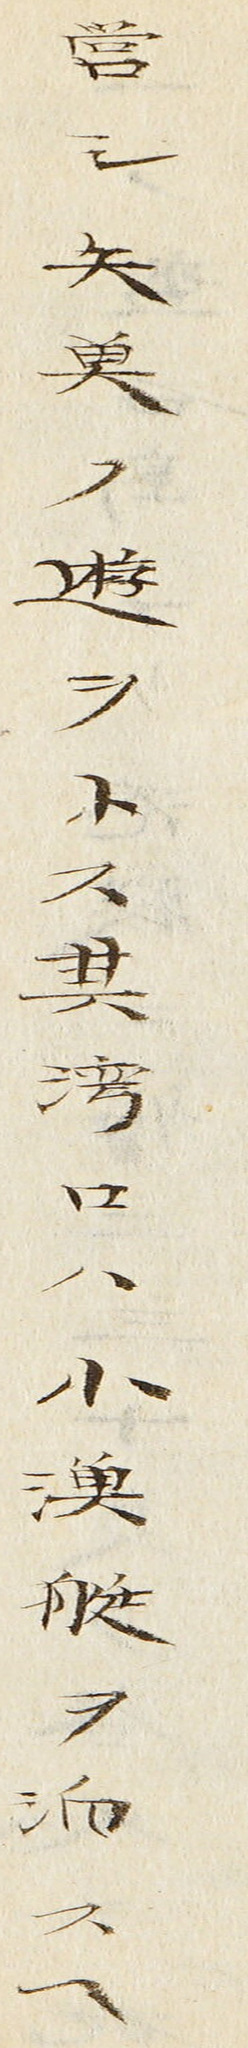営シ矢魚？ノ遊ヲトス其湾口ハ小漁艇ヲ泊スヘ
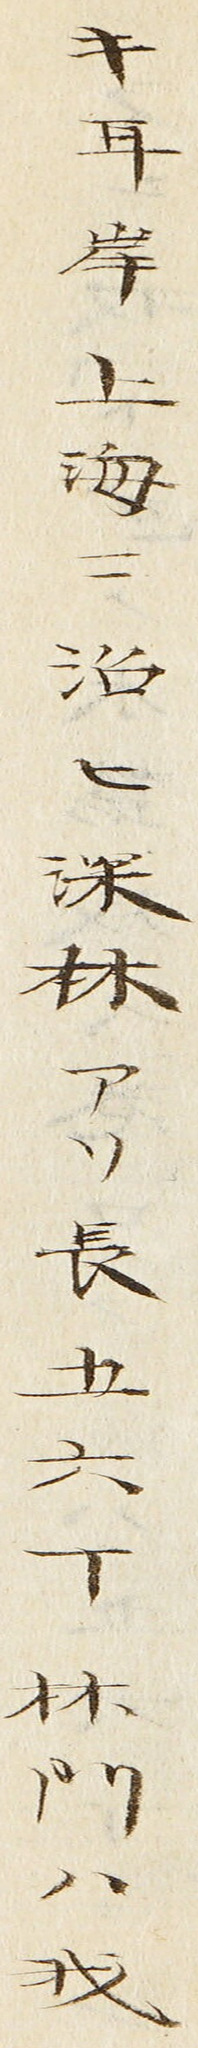キ耳岸上海ニ沿ヒ深林アリ長五六丁林門ハ我
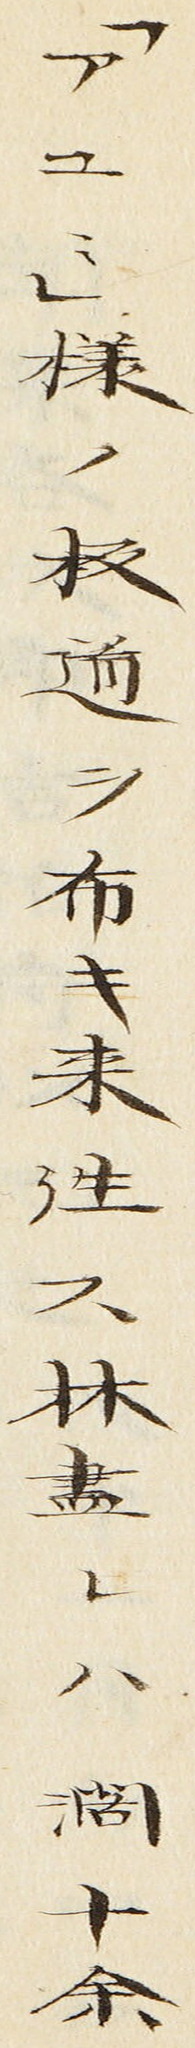「アユミ」様ノ板道ヲ布キ来往ス林盡レハ濶十余
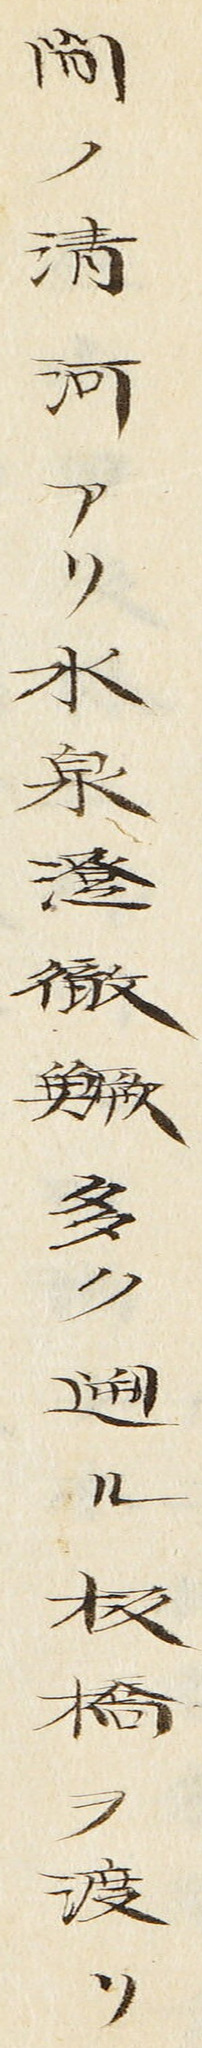間ノ清河アリ水泉澄徹鱖多ク遡ル板橋ヲ渡リ
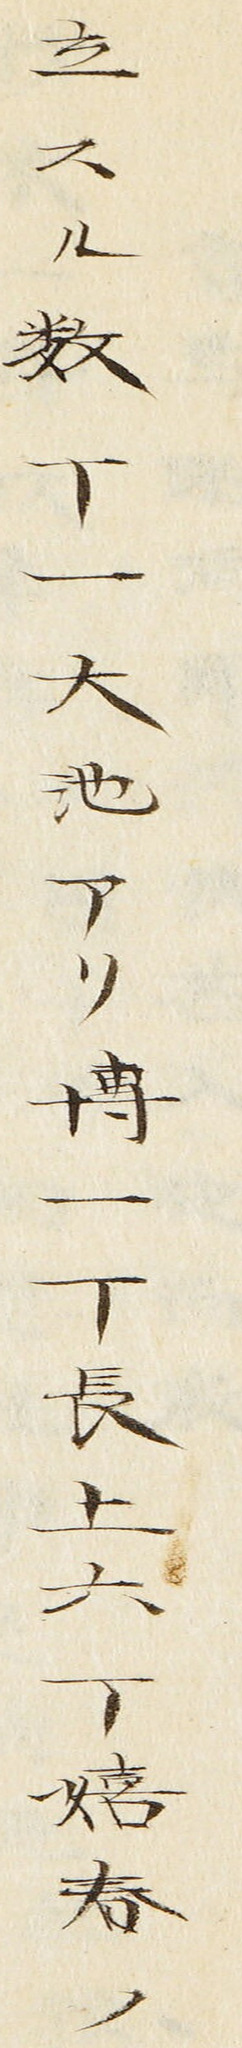立スル数丁一大池アリ博一丁長上六丁嬉春ノ
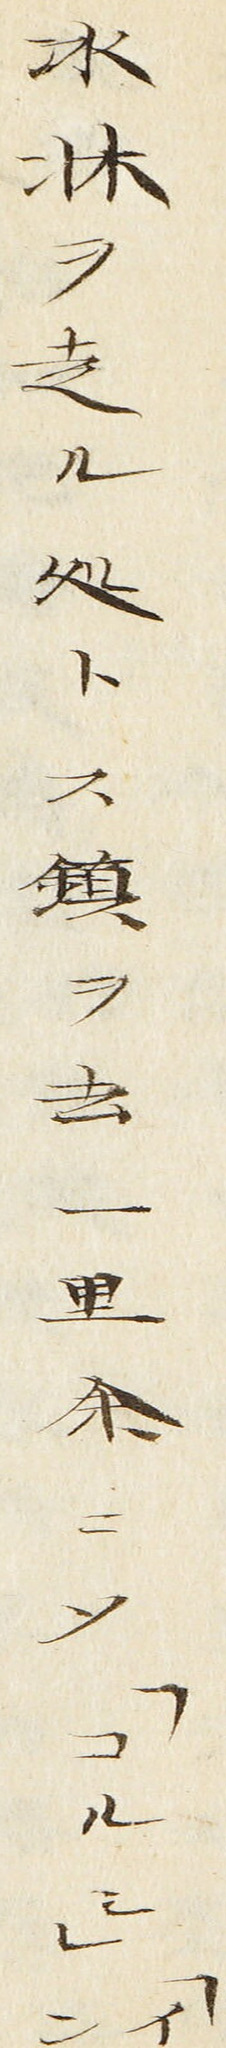冰牀ヲ走ル処トス鎮ヲ去一里余ニシテ「コルシ」「イン
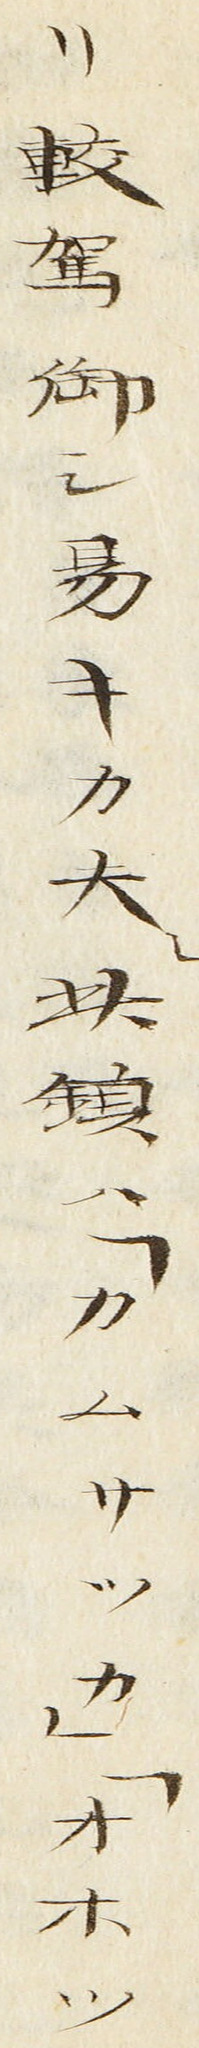リ較駕御シ易キカ大此鎮ハ「カムサツカ」「オホツ
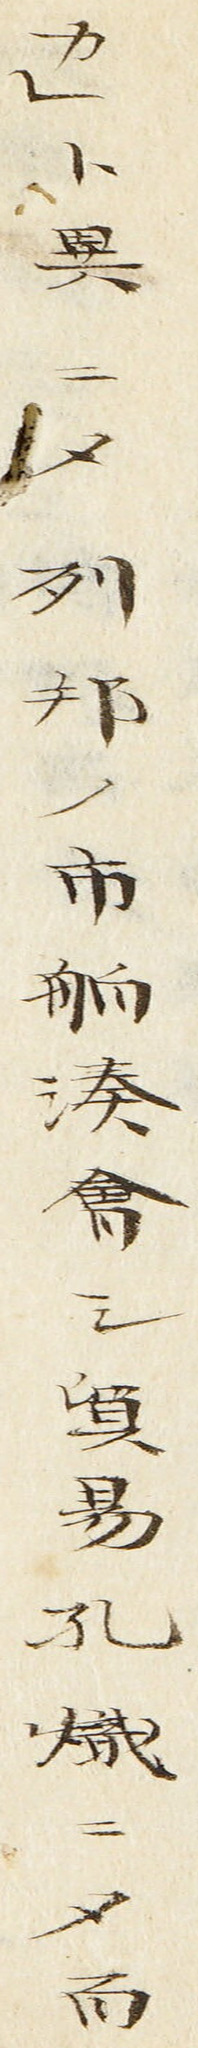カ」ト異ニシテ列邦ノ市舶湊會シ貿易孔熾ニシテ百
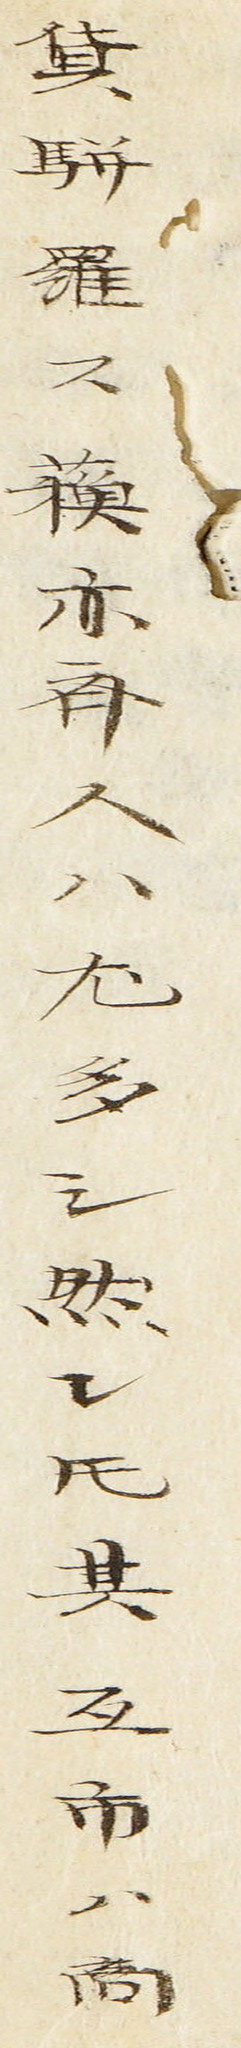貨駢羅ス蘓亦斉人ハ尤多シ然レトモ其互市ハ商
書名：蕃談
